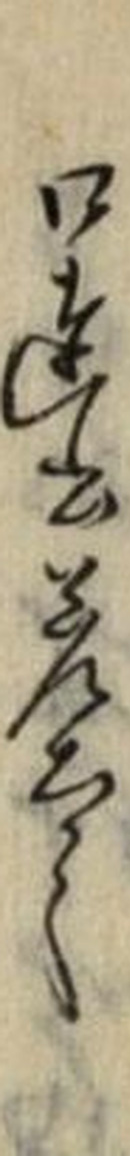口達書差出之
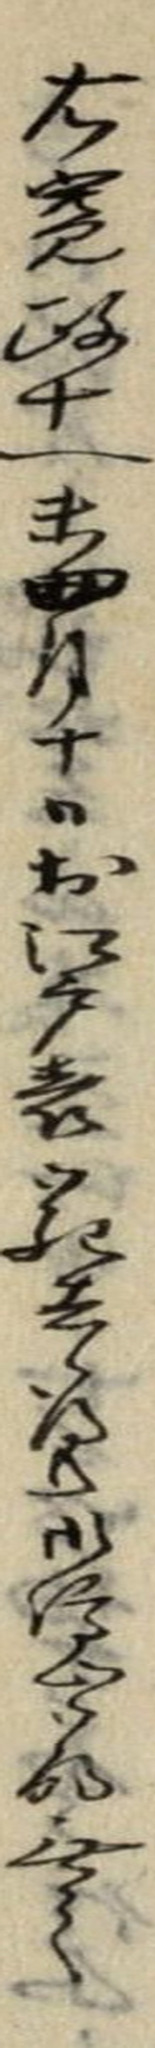右寛政十一未四月十日於江戸表御死去候得共御停止御触無之
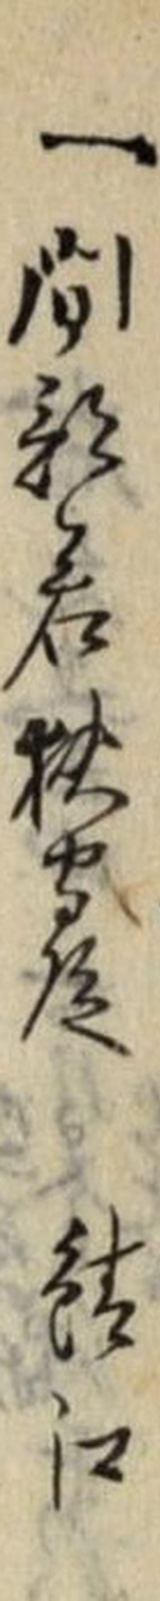一間部若狭守殿鯖江
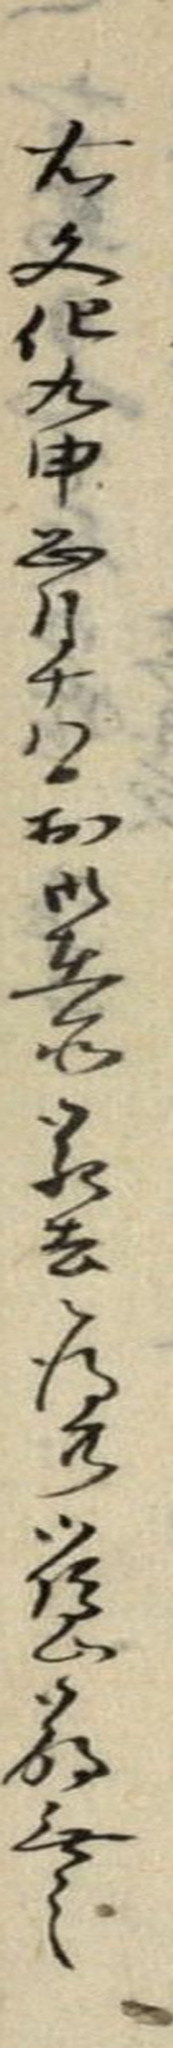右文化九申正月十八日於御在所御死去候得共御停止御触無之
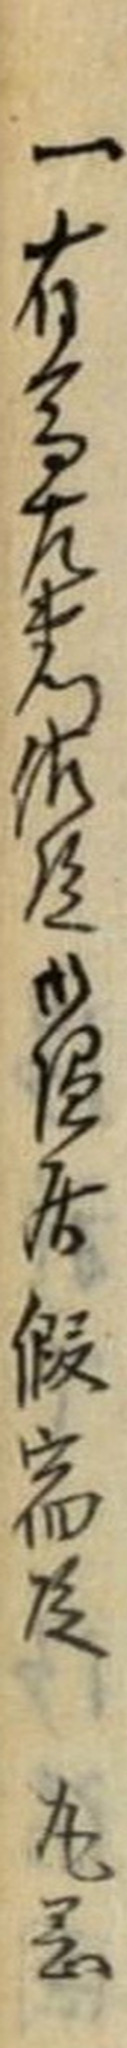一有馬左衛門佐殿御隠居仮宿殿丸岡
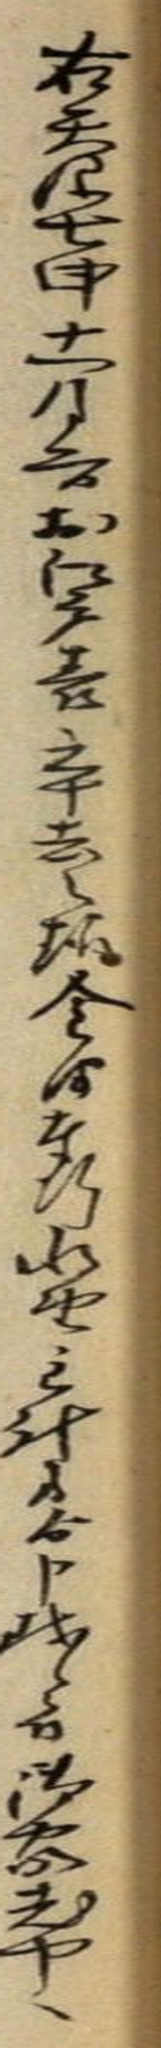右天保七申十一月二日於江戸表卒去之趣金津奉行水野主計方ゟ申越候に付御家老中へ
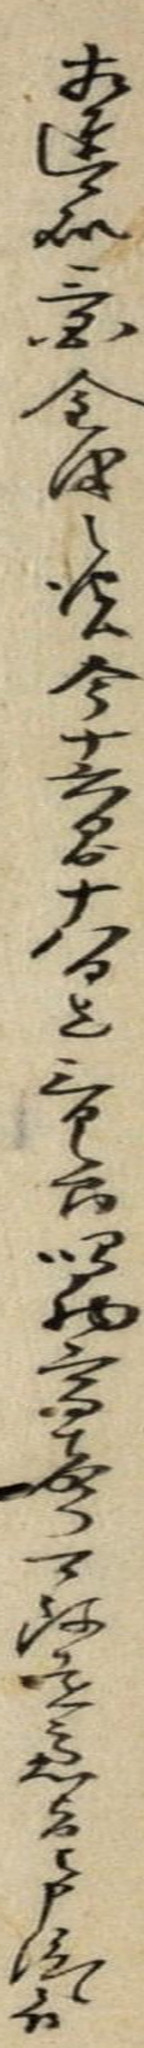相達候処三国金津之儀は今十六日ゟ十八日迄三日之間鳴物高声可致遠慮旨被申渡候に付
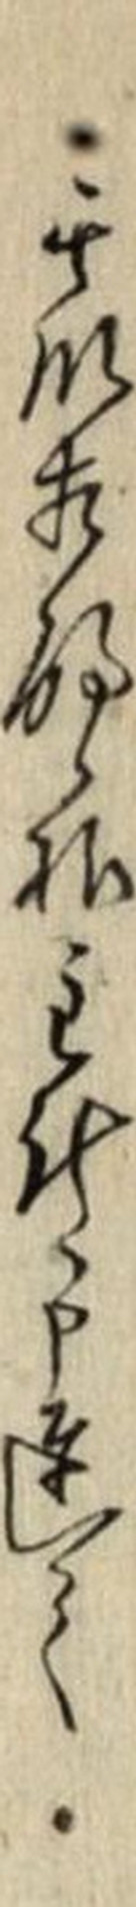其段相触候様主計へ申達之
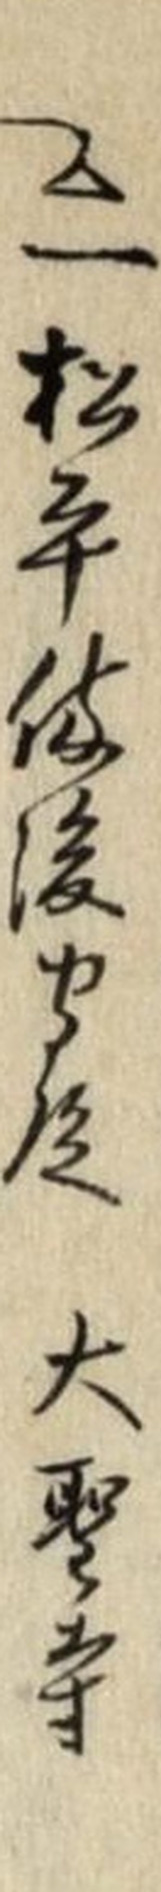△一松平備後守殿大聖寺
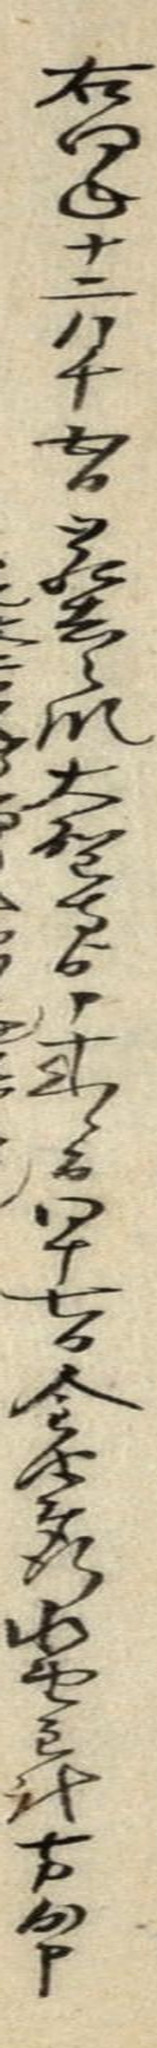右同年十二月十五日御死去之段大聖寺ゟ申来候旨同十七日金津奉行水野主計方ゟ申
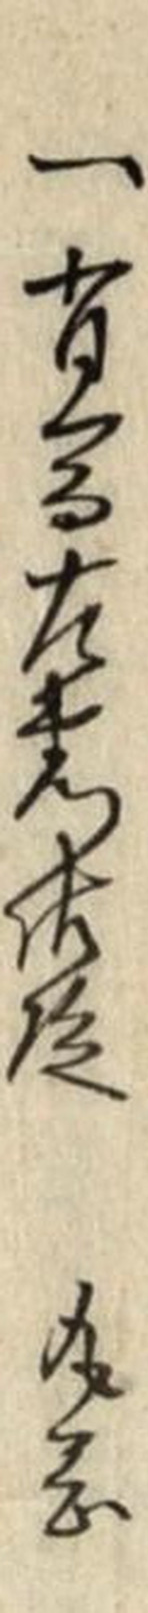一有馬左衛門佐殿丸岡
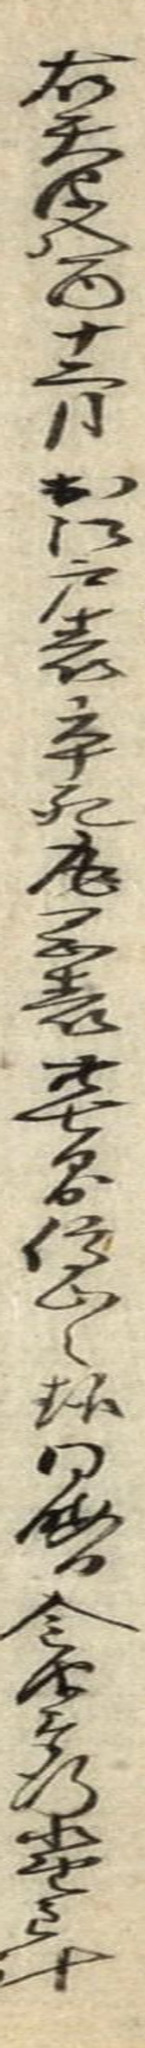右天保八酉十二月於江戸表卒死丸岡表廿七日ゟ停止之趣同晦日金津奉行水野主計
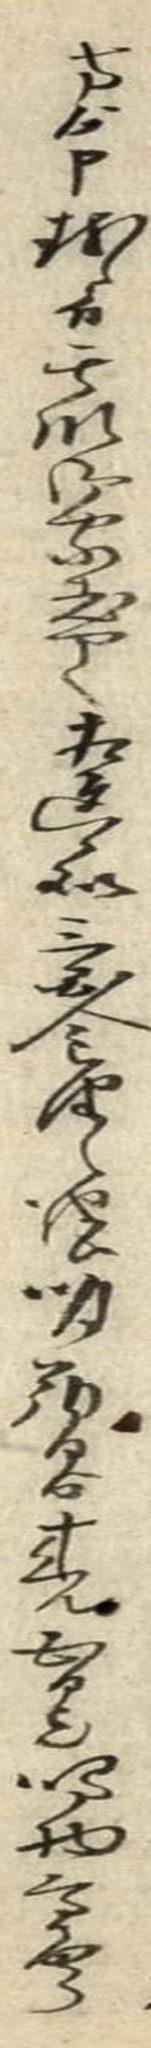方ゟ申越候に付其段御家老中へ相達候処三国金津之儀は明朔日ゟ来ル五日迄鳴物高声
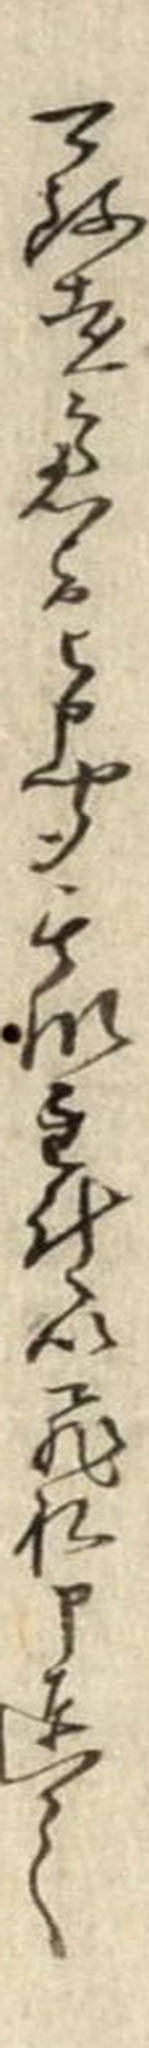可致遠慮旨被申聞其段主計へ以飛札申達之
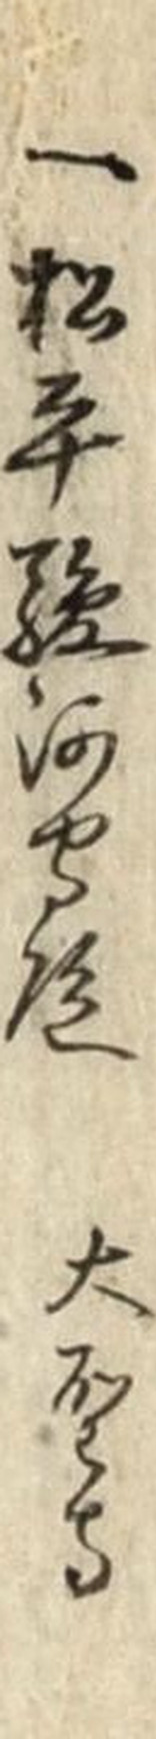一松平駿河守殿大聖寺
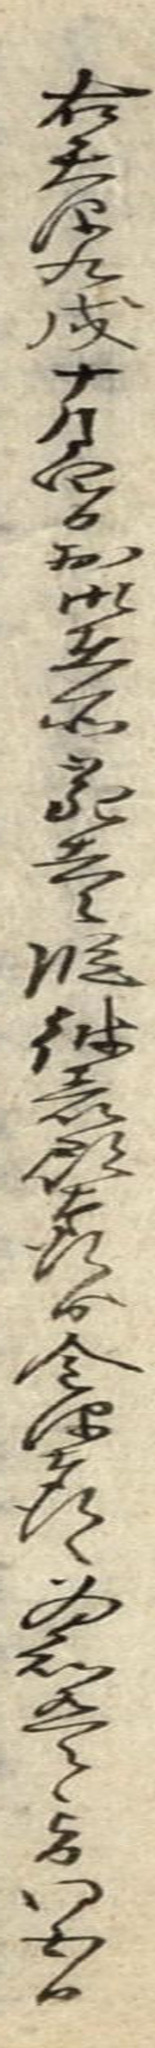右天保九戌十月四日於御在所御死去之段彼表郡奉行ゟ金津奉行へ為知有之候旨同五日
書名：御停止異変死失
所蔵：福井県文書館 Fukui Prefectural Archives
